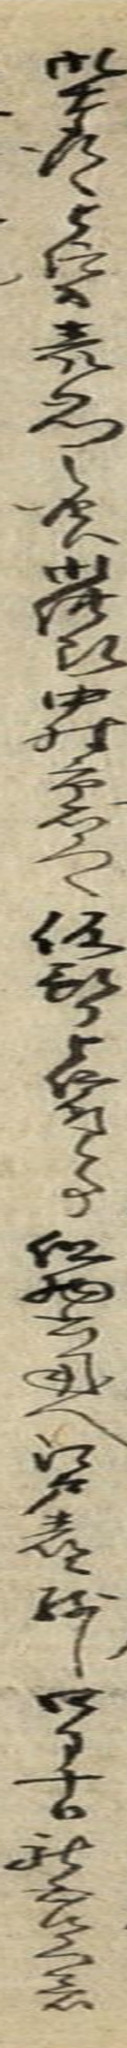御奉行へ被仰付表御門之儀は御供頭中村市右衛門へ仮預り被仰付候事但物書用人江戸表へ残し四月十日新五左衛門着
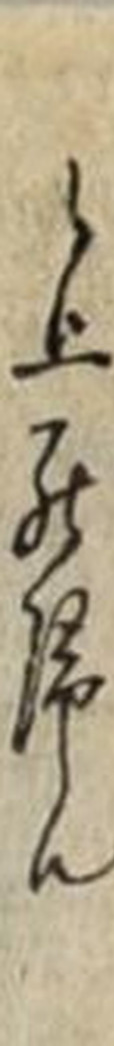候上罷帰る
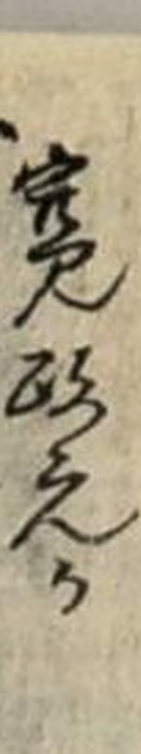寛政元か
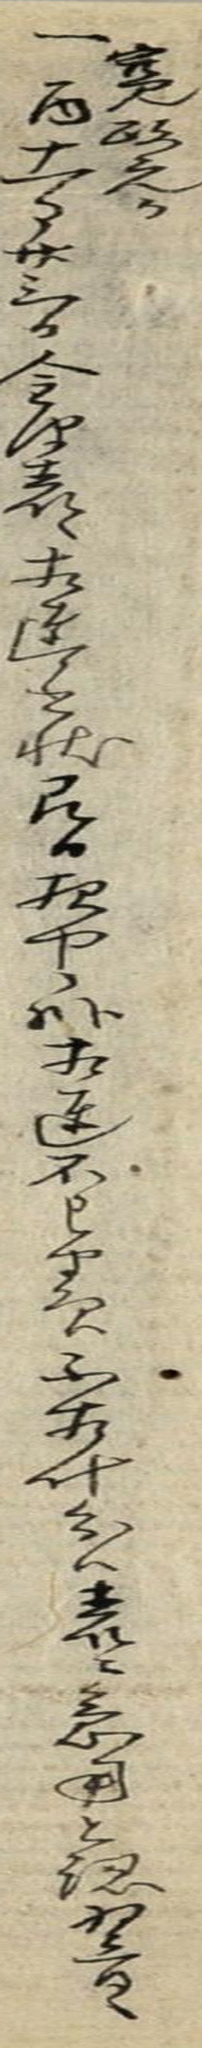一酉十一月廿三日金津表へ相達候書状即日夜中へ掛相達不申候半而は不相叶分は表に急用と認翌日へ
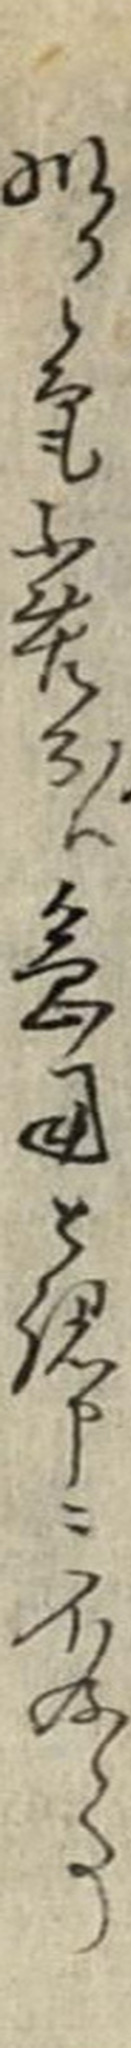掛り候而も不苦分は急用と認申に不及候事
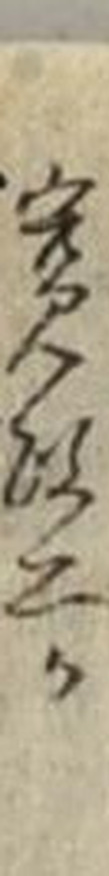寛政二か
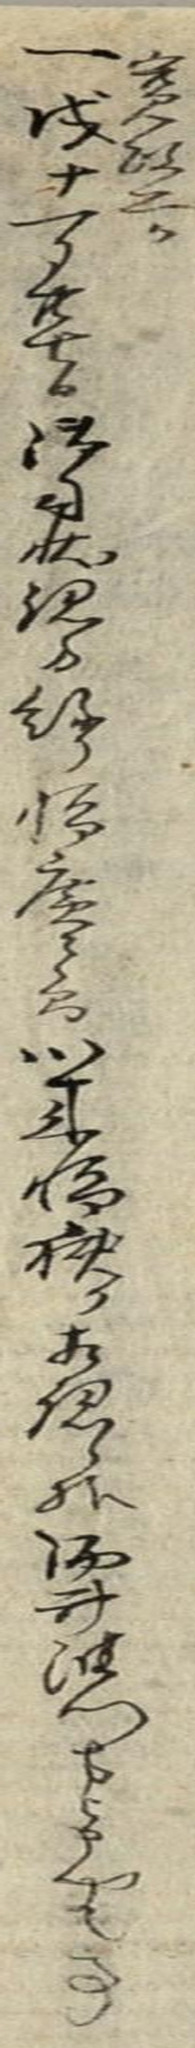一戌十一月廿七日御用状認方餘り幅広に候間以来幅狭く相認候様酒井波門方被申聞候事
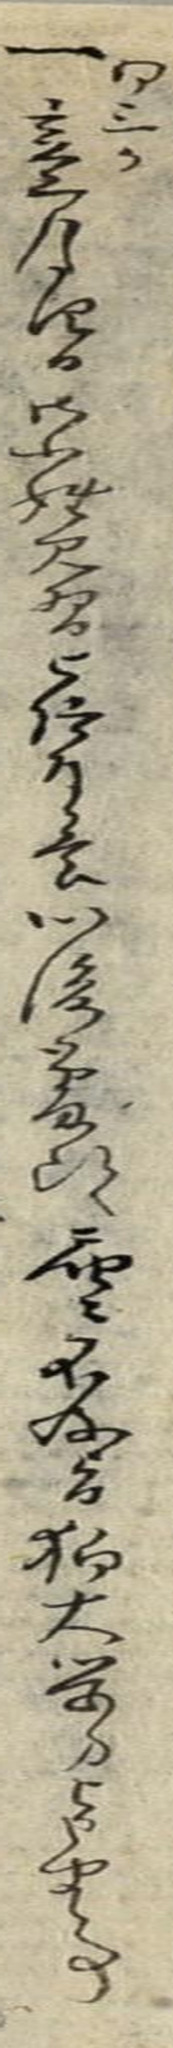一亥三月四日御小姓見習被仰付候節以後御番頭へ届に不及旨狛大学方被申聞候事
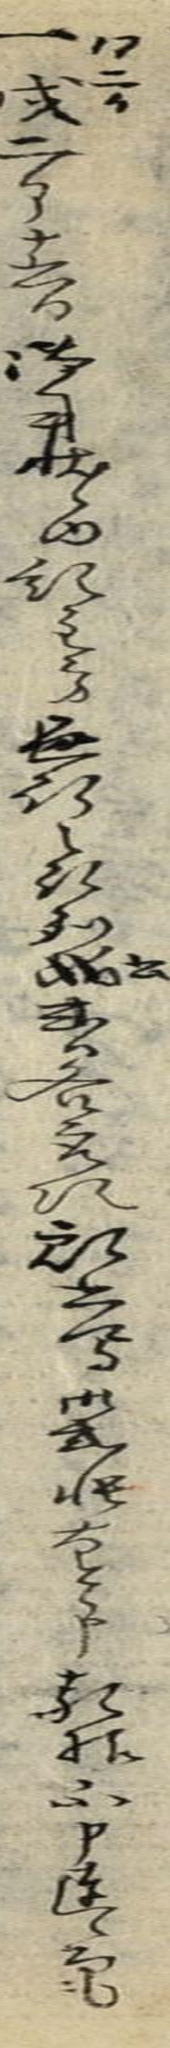一戌二月十六日御用状之内預主方通行之行列書或は各取次願書写御式帳なとゝ申類様不申達候而も
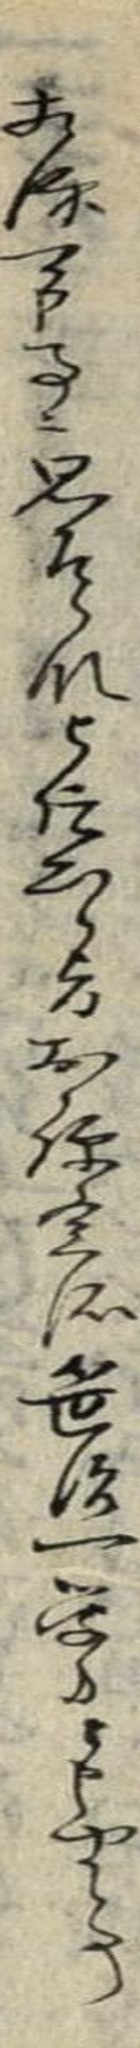相済可申事に思召候段被仰出候旨於評定所笹治一学方被申聞候事
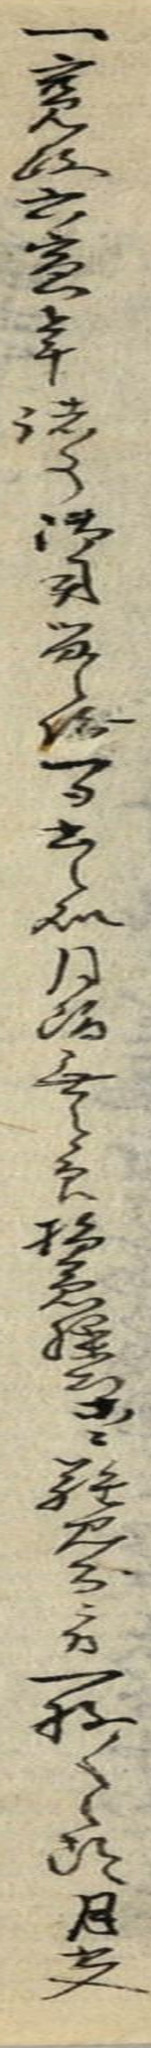一寛政六寅年諸事御用留之儀一ッ書之処月附無之候而は指急繰出等に難見分に付一枚之頭へ月書入
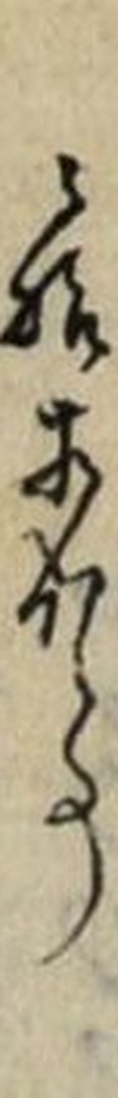候様相成候事
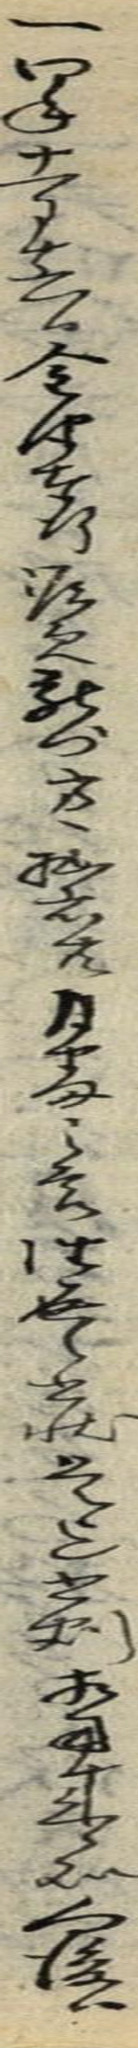一同年十一月十六日金津奉行渥美新右衛門方へ拙者共月番之節往返之書状是迄書判相用来候処向後は
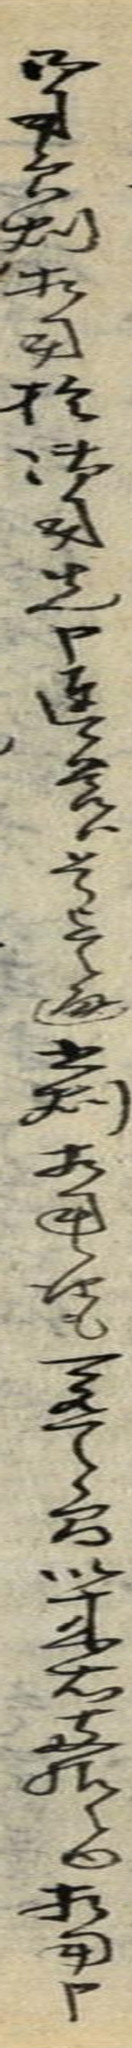御用印判相用於御用先申達候節は是迄之通書判相用候儀も可有之候間以来右両様之内相用申
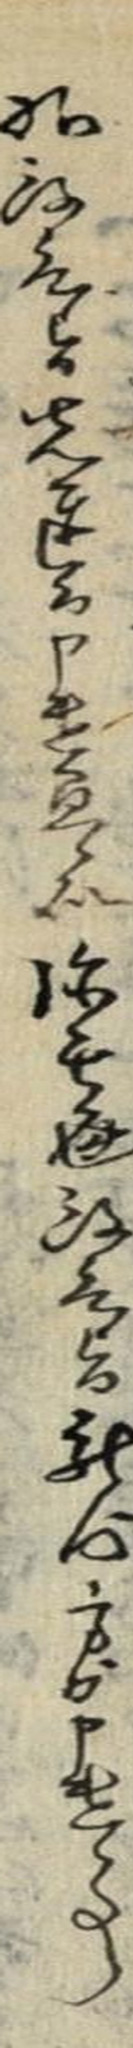様致度旨先達而申遣置候処弥其通致度旨新右衛門方ゟ申遣候事
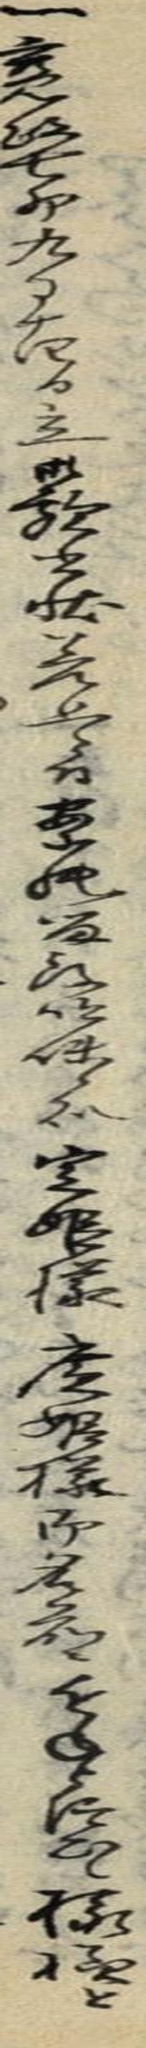一寛政七卯九月十四日立御歓書状差上候に付案紙留致吟味候処定姫様広姫様御名前に近年仰出候様様と
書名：蒐輯之部
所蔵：福井県文書館 Fukui Prefectural Archives
